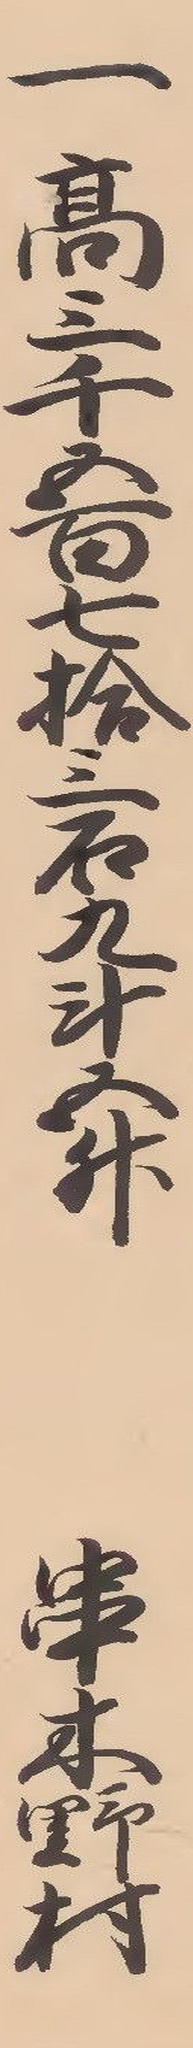一高三千五百七拾三石九斗五升串木野村
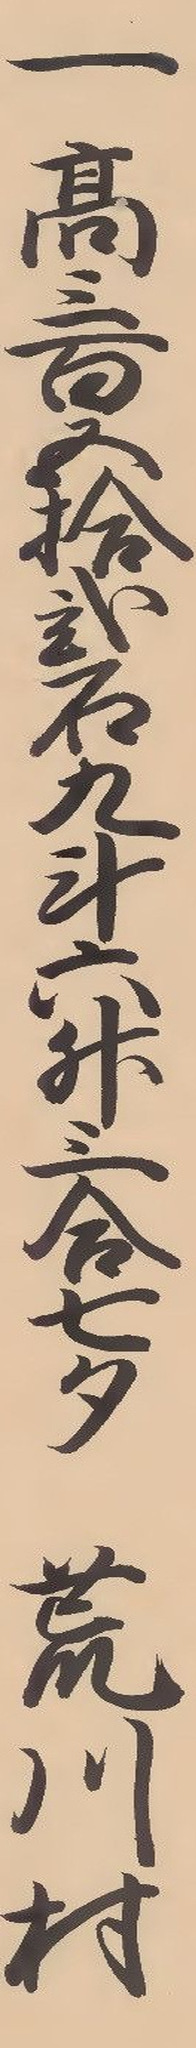一高三百五拾弐石九斗六升三合七勺荒川村
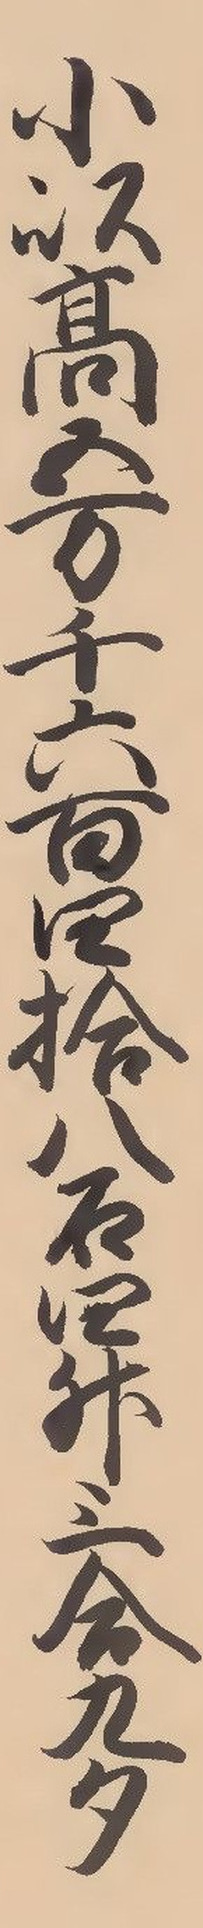小以高五万千六百四拾八石四升三合九勺

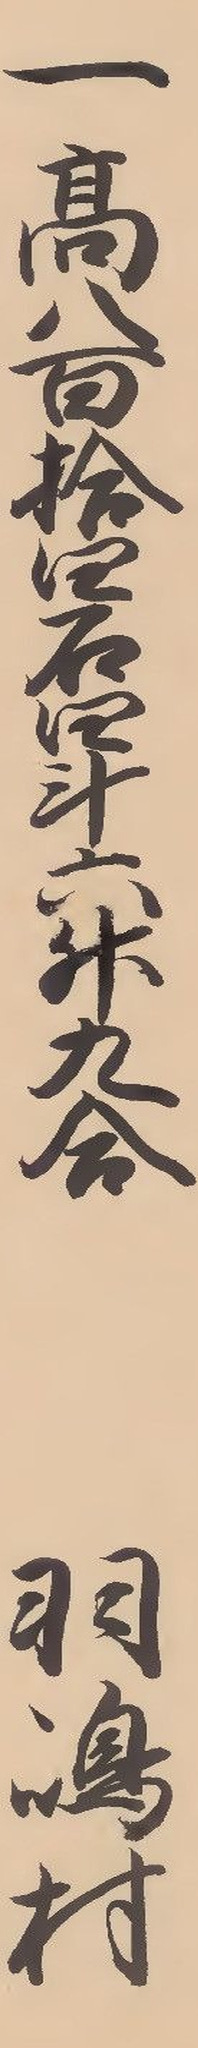一高八百拾四石四斗六升九合羽島村
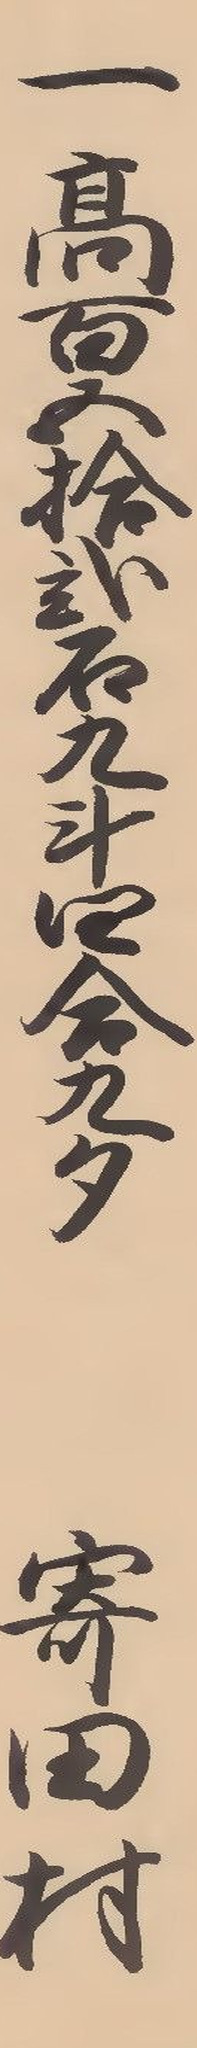一高百五拾弐石九斗四合九勺寄田村
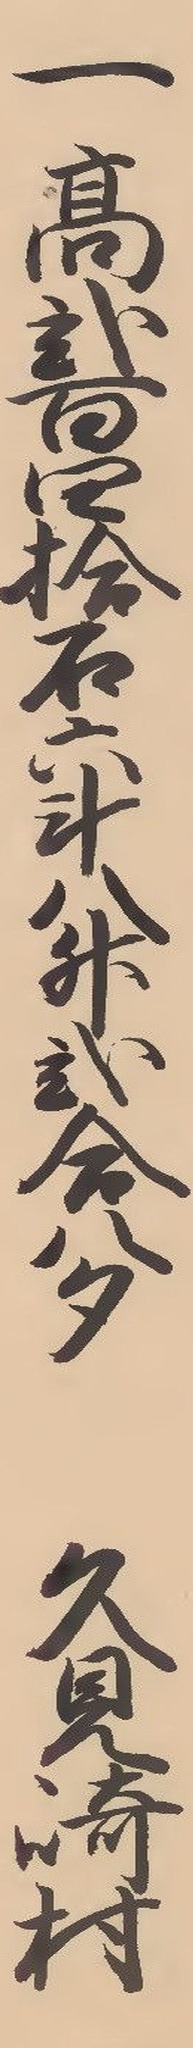一高弐百四拾石六斗八升弐合八勺久見崎村
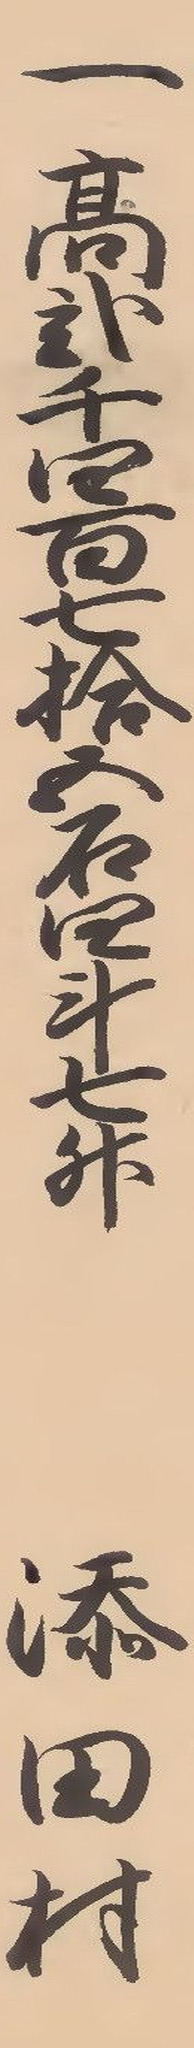一高弐千四百七拾五石四斗七升添田村
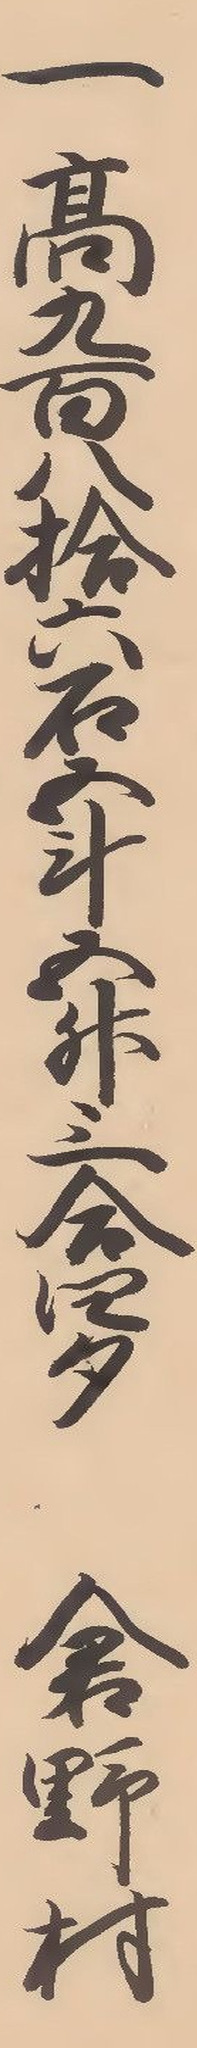一高九百八拾六石五斗五升三合四勺倉野村
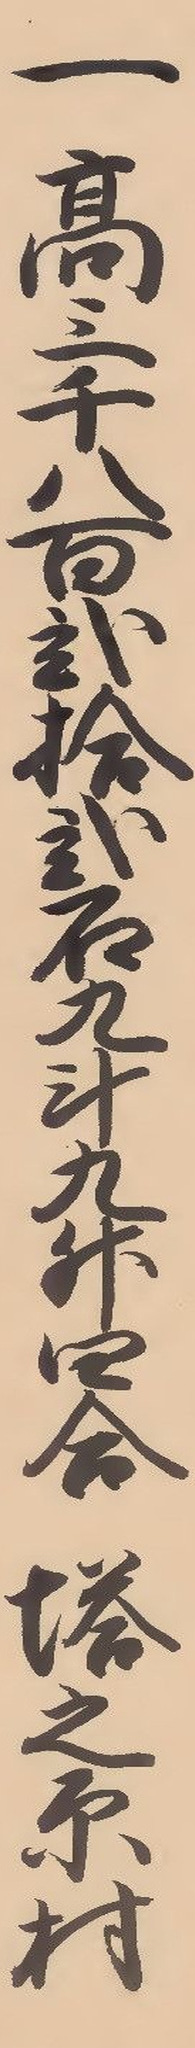一高三千八百弐拾弐石九斗九升四合塔之原村
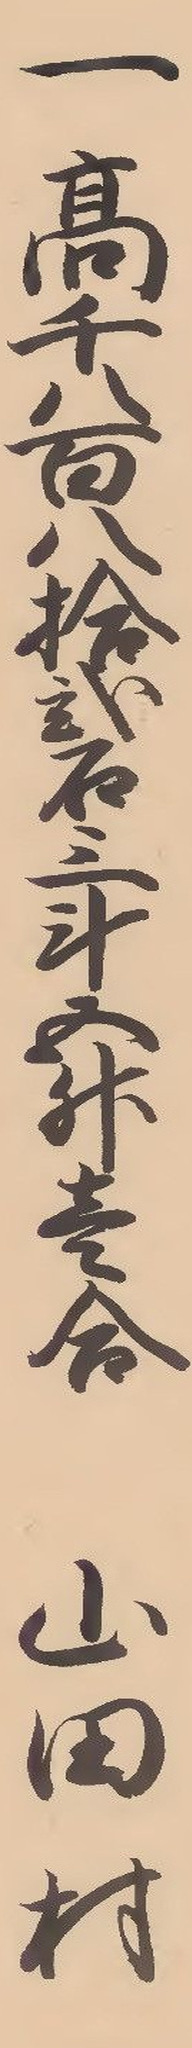一高千八百八拾弐石三斗五升壱合山田村

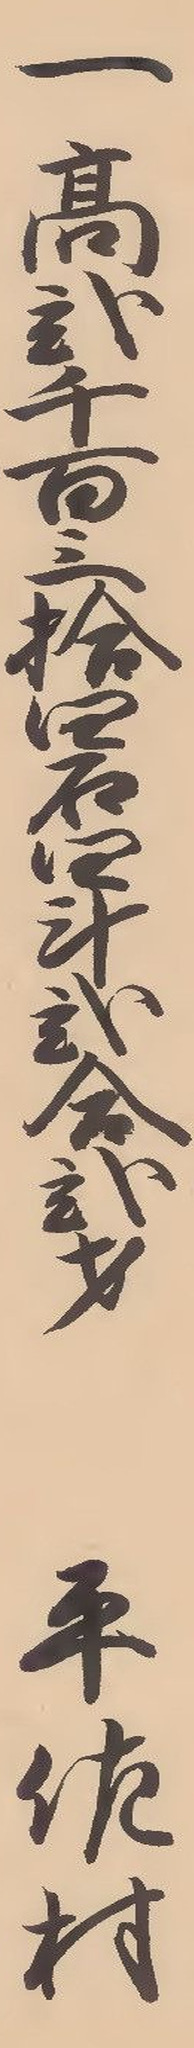一高弐千百三拾四石四斗弐合弐才平佐村
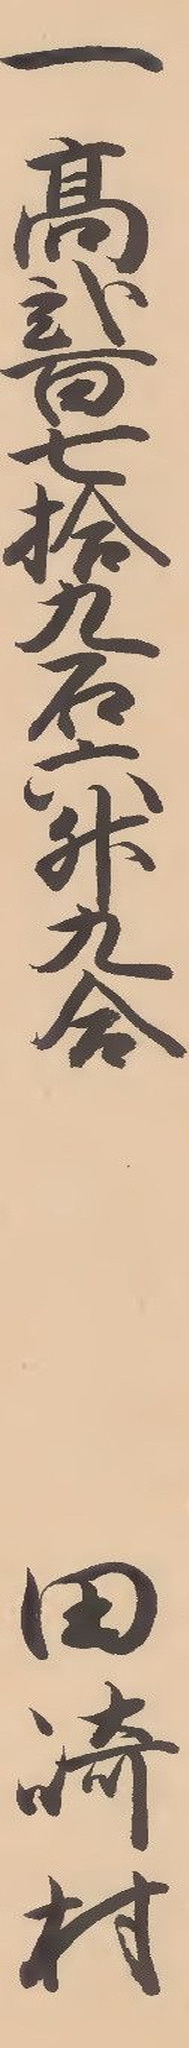一高弐百七拾九石六升九合田崎村
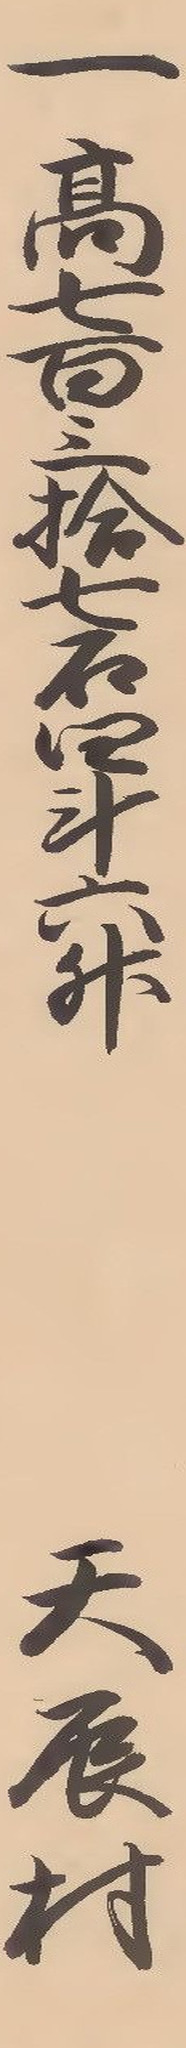一高七百三拾七石四斗六升天辰村
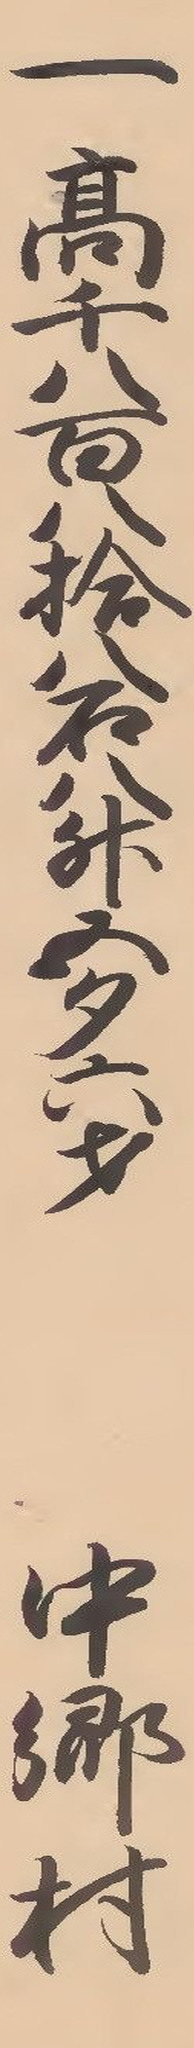一高千八百八拾八石八升五勺六才中郷村
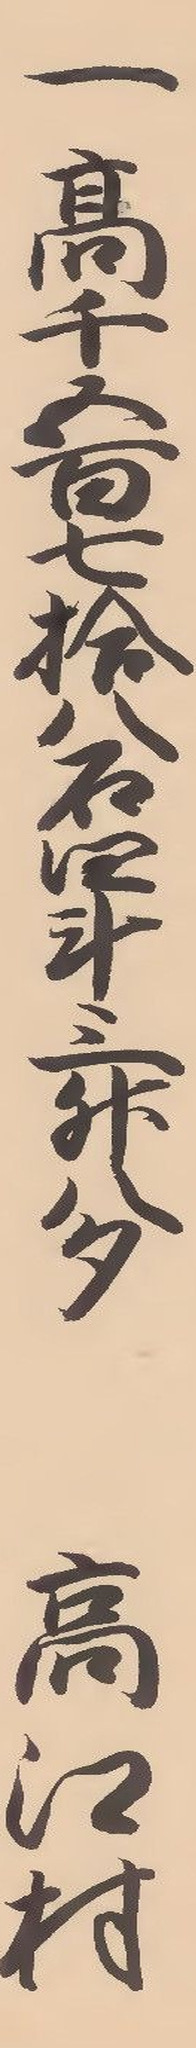一高千五百七拾八石四斗三升八勺高江村
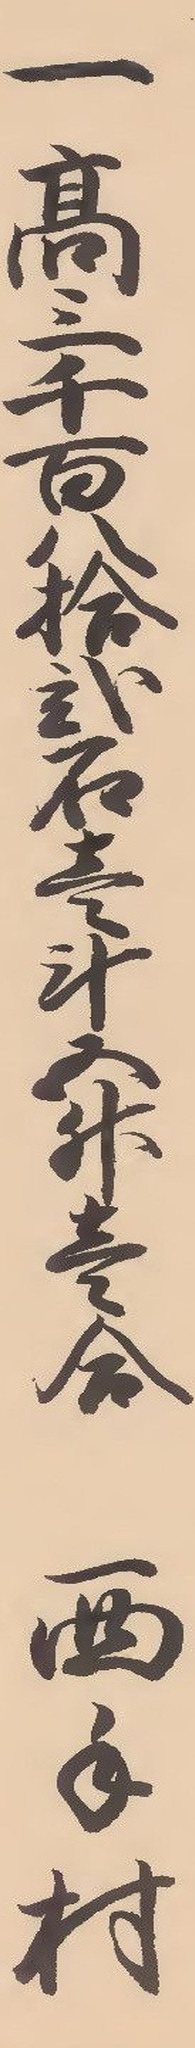一高三千百八拾弐石壱斗五升壱合西手村
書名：薩摩国郷帳
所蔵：国立公文書館 National Archives of Japan
